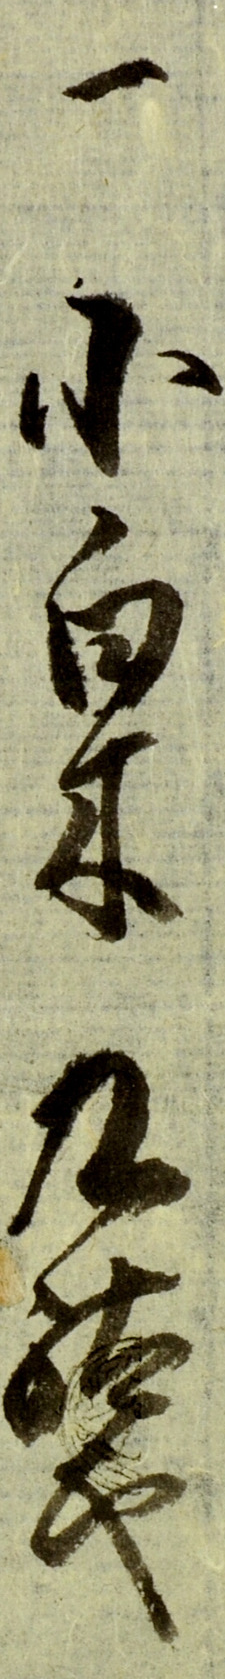一小白木九駄也
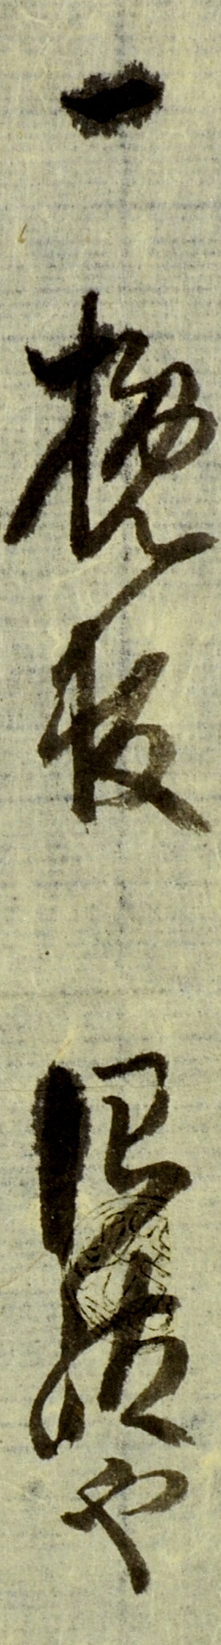一挽板四駄也
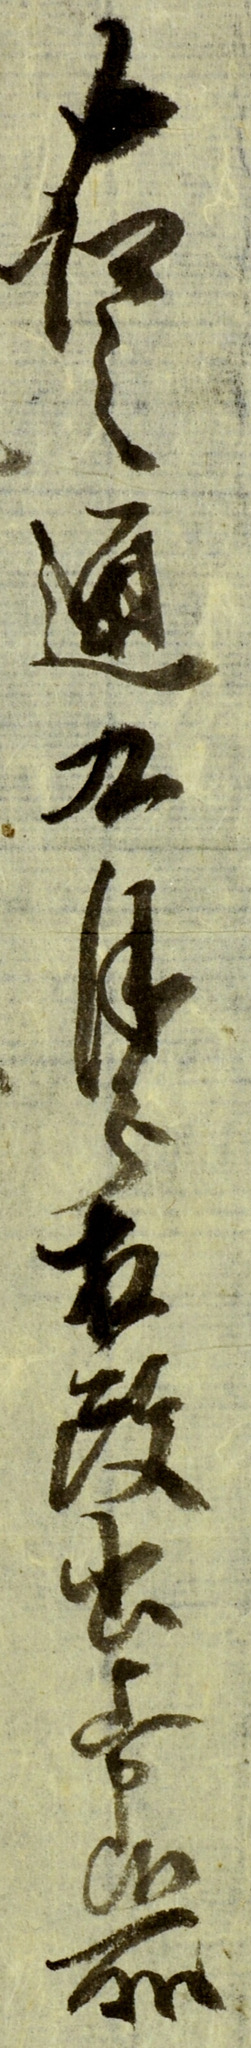右之通九月分相改書上申候所
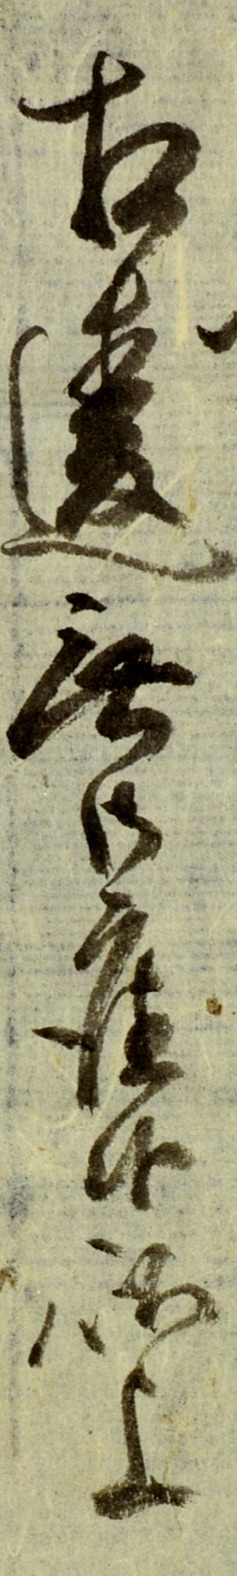相違無御座候以上
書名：覚
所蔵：伊那市立高遠町図書館・合同会社AMANE
